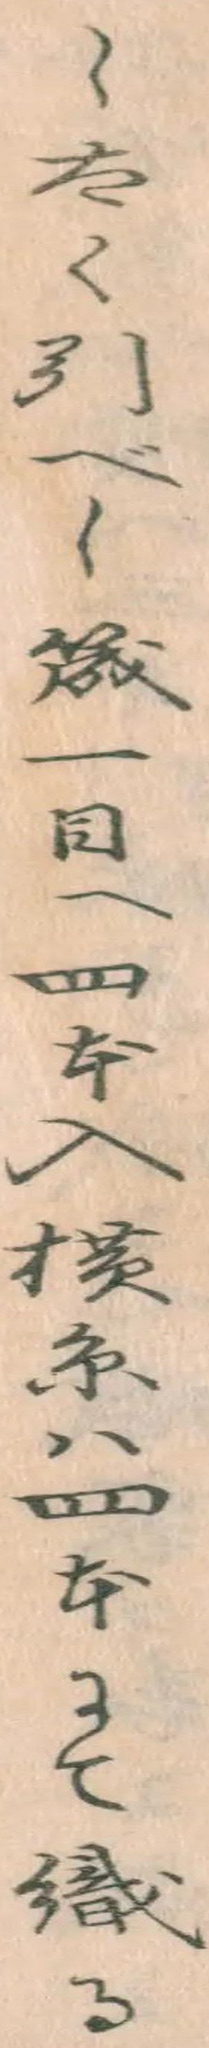し太く引べし筬一目へ四本入横糸は四本にて織る
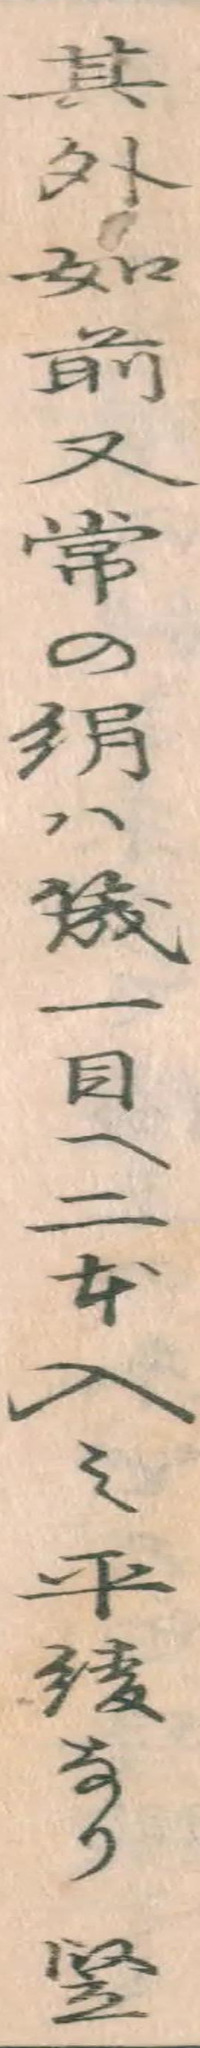其外如前又常の絹は筬一目へ二本入之平綾なり竪
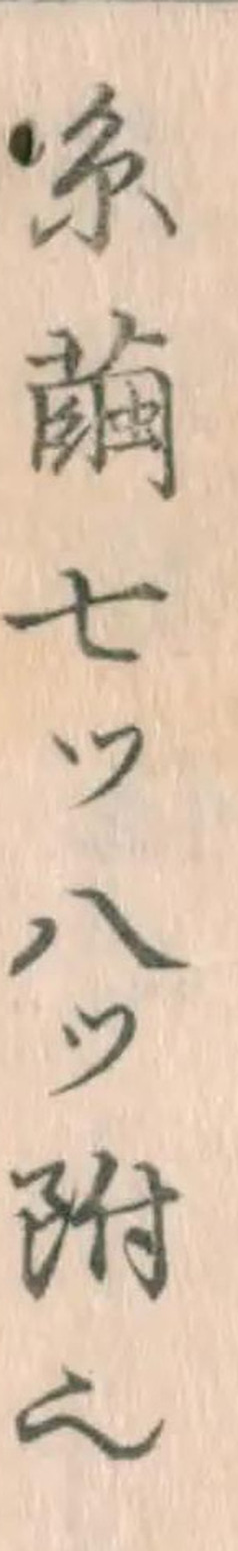糸繭七ッ八ッ附也
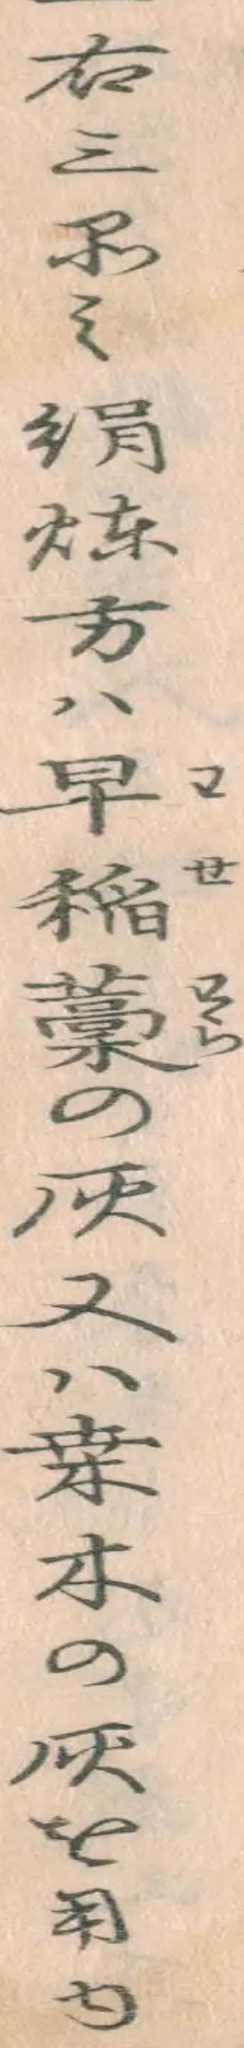一右三品之絹煉方は早稲藁の灰又は桑木の灰を用ゆ
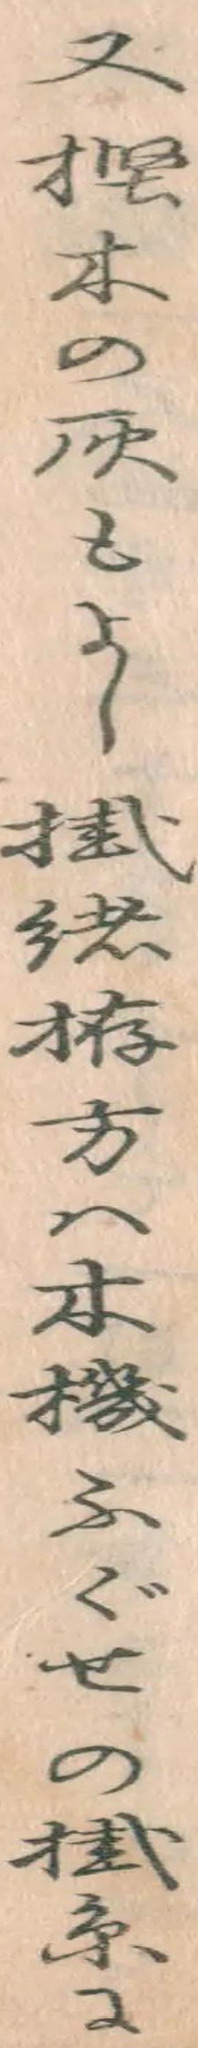又樫木の灰もよし掛緒拵方は木機ふぐせの掛糸に

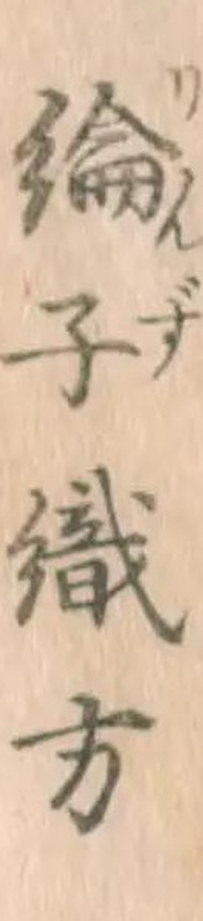綸子織方
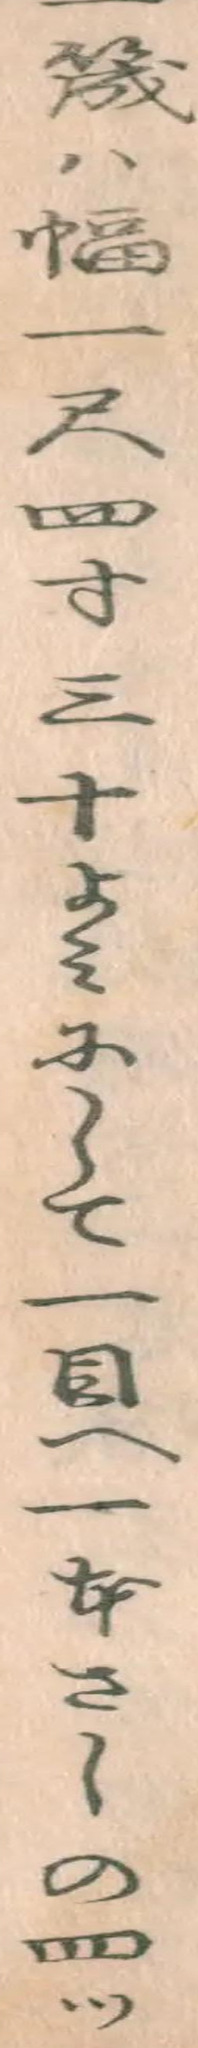一筬は幅一尺四寸三十よみにして一目へ一本さしの四ッ
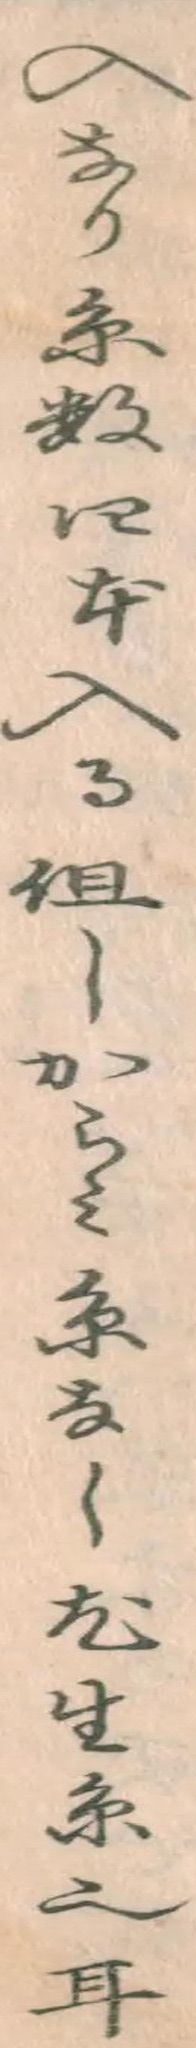入なり糸数四本入る但しからみ糸なし尤生糸也耳
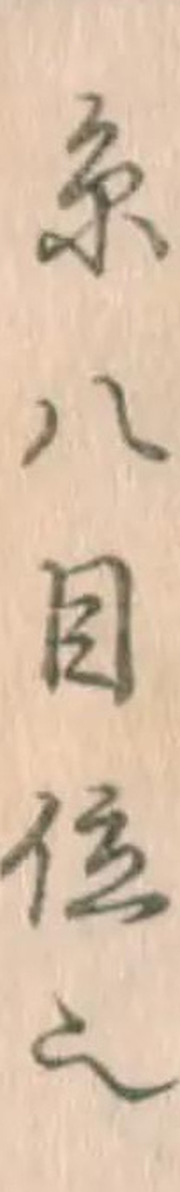糸八目位也
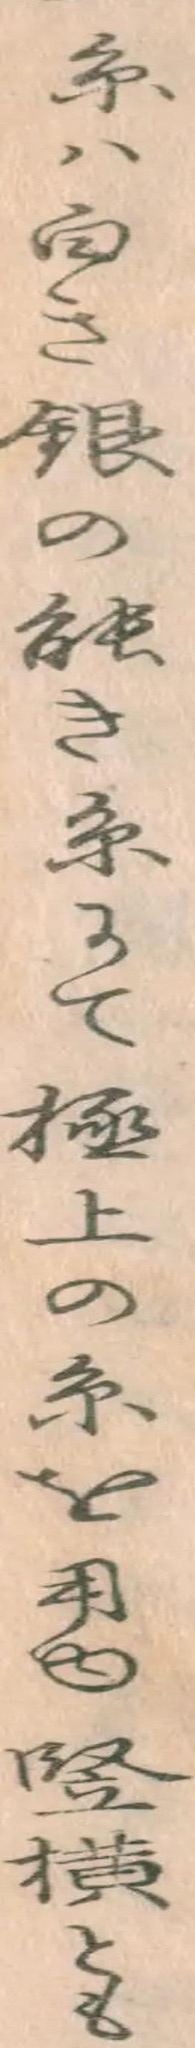一糸は白き銀の能き糸にて極上の糸を用ゆ竪横とも
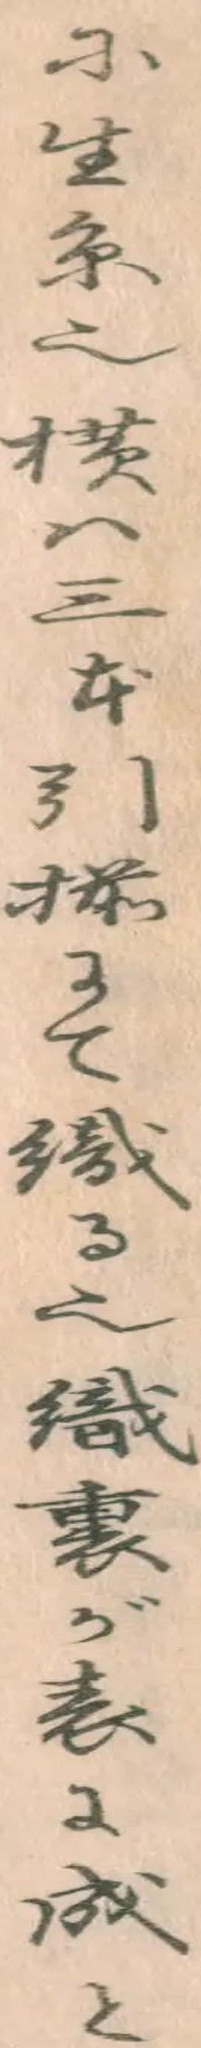に生糸也横は三本引揃にて織る也織裏が表に成と
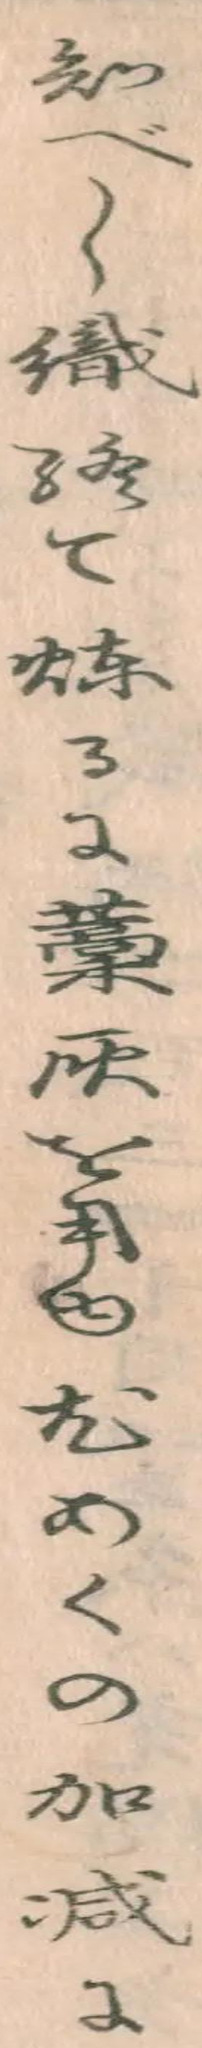知べし織終て煉るに藁灰を用ゆ尤あくの加減に
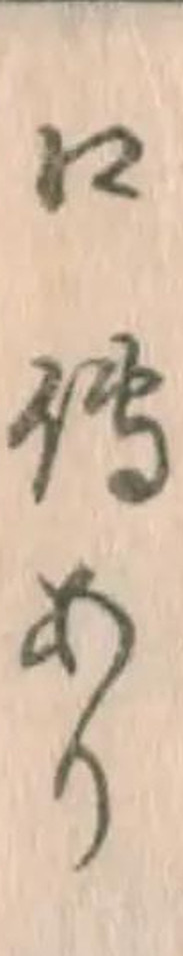口伝あり
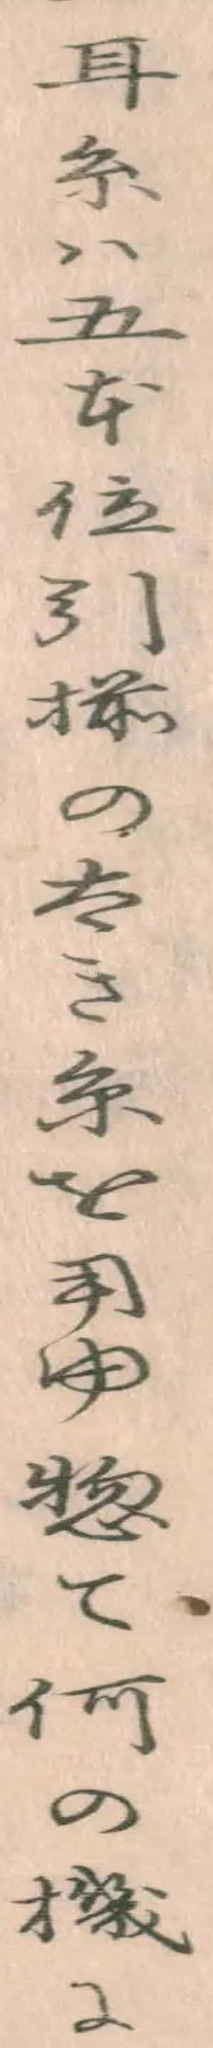一耳糸は五本位引揃の太き糸を用ゆ惣て何の機に
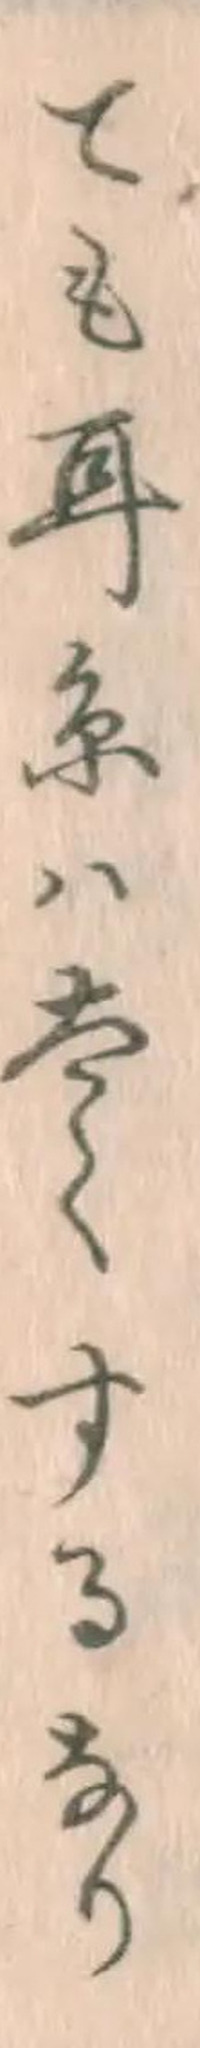ても耳糸は太くするなり
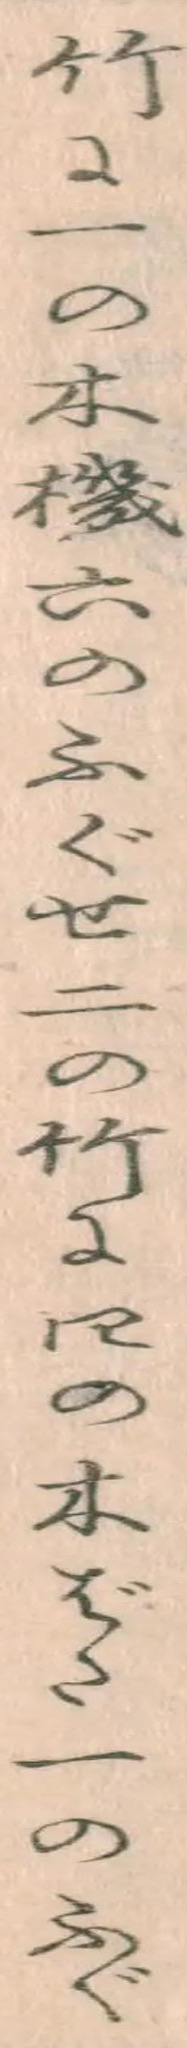竹に一の木機六のふぐせ二の竹に四の木ばた一のふぐ
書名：機織彙編 5巻. [2]
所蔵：国立国会図書館 National Diet Library, JAPAN
